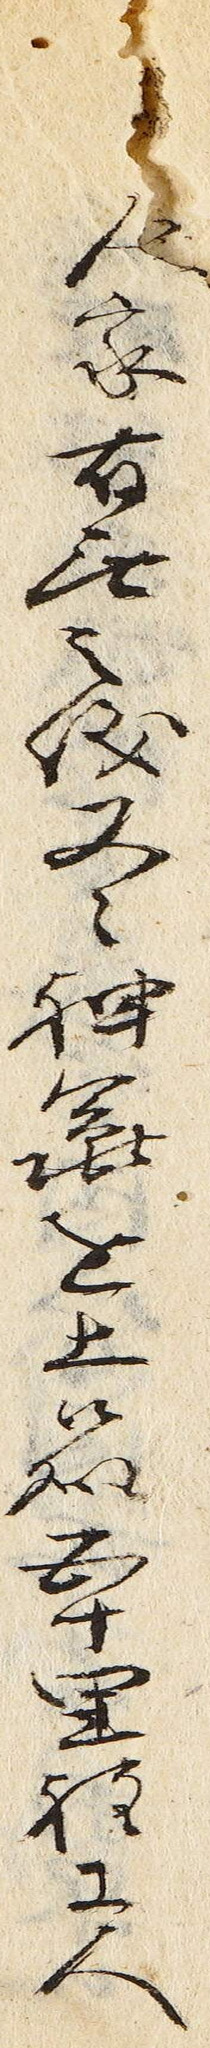人家有無之儀又々神鬮を上候処五十里程に人
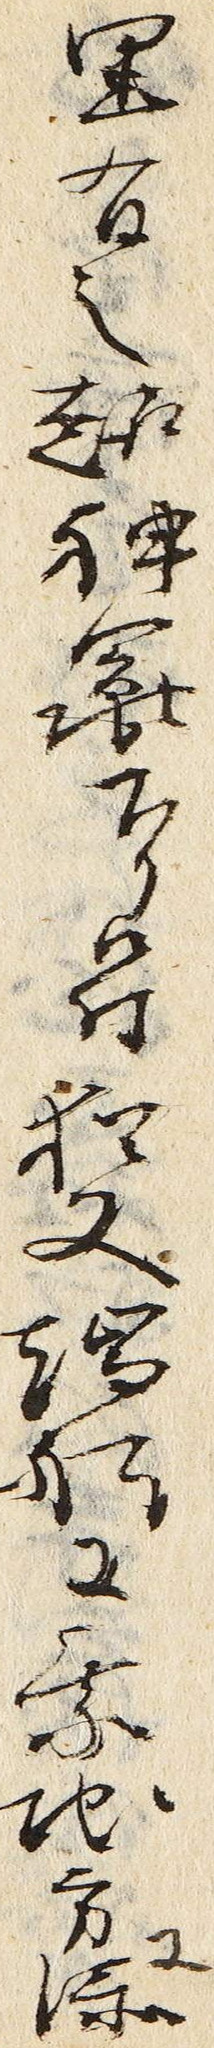里有之趣神鬮下り候付猶又端船に乗地方に添
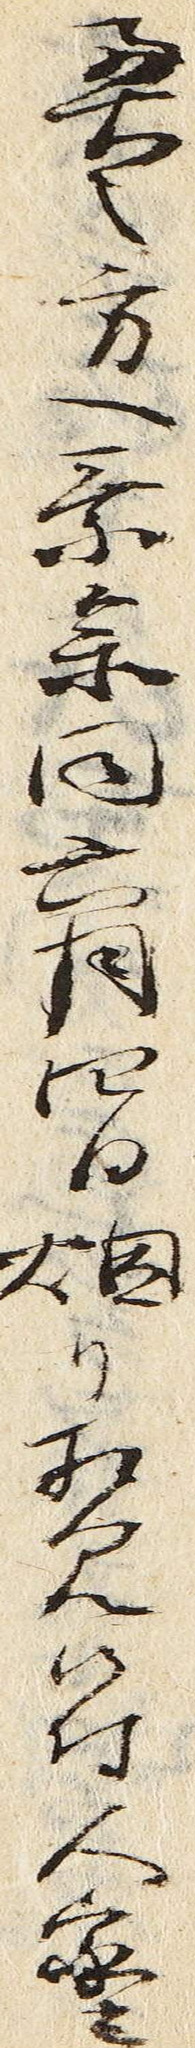奥之方へ乗参同六月四日烟り相見候付人家と
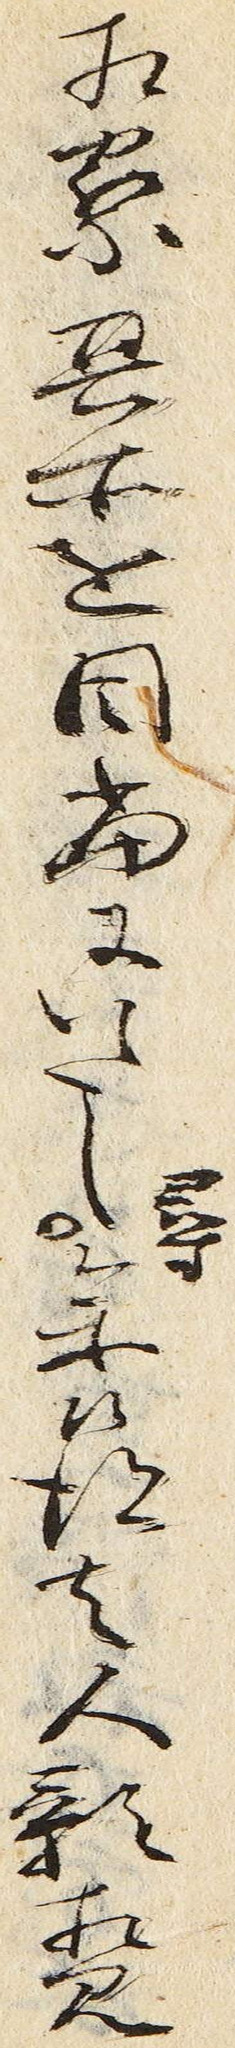相察其所を目当にいたし◦参候得は人影相見
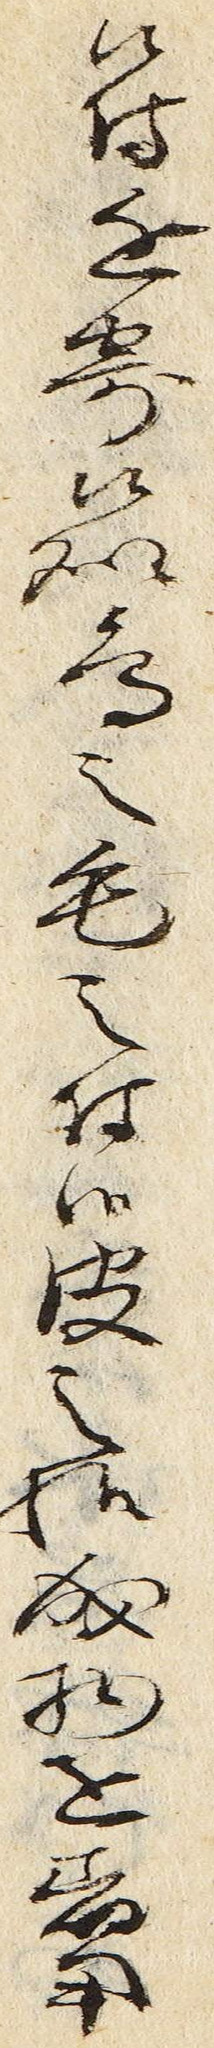候付近寄候処鳥之毛之付候皮之様成物を着用
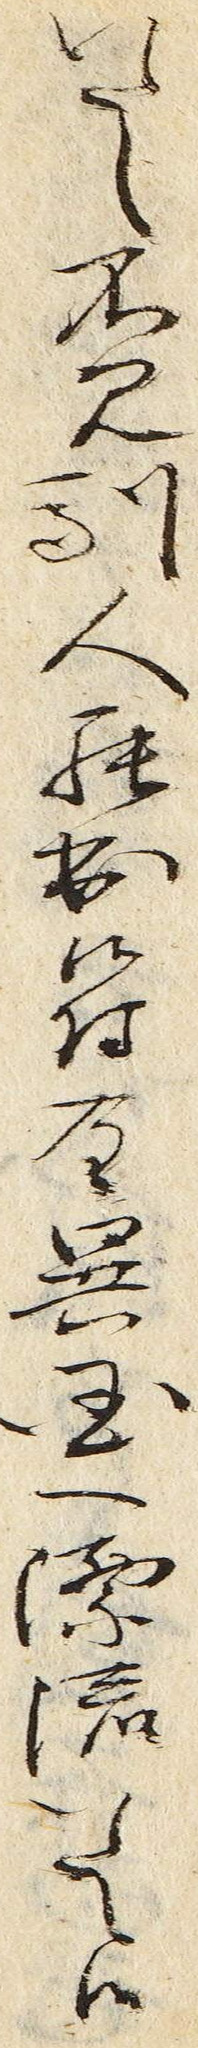いたし不見馴人罷出候付全異国へ漂流いたし候
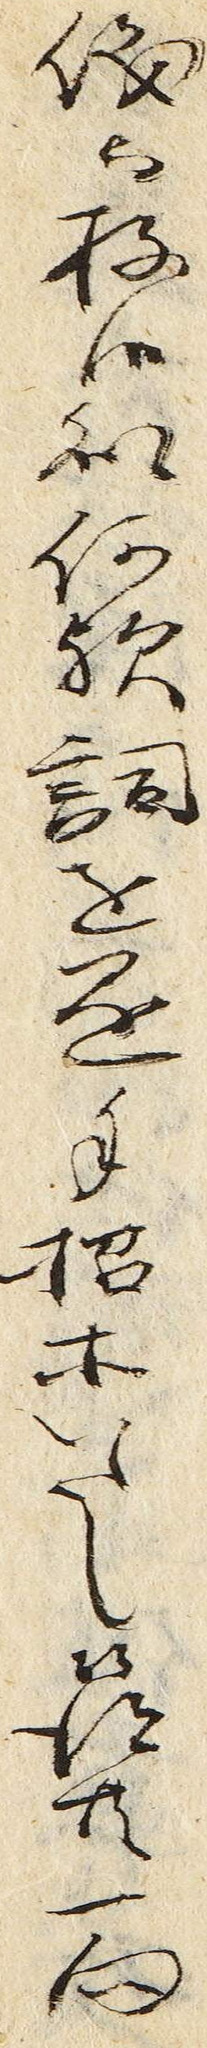儀と存候処何歟詞を懸手招等いたし候得共一向
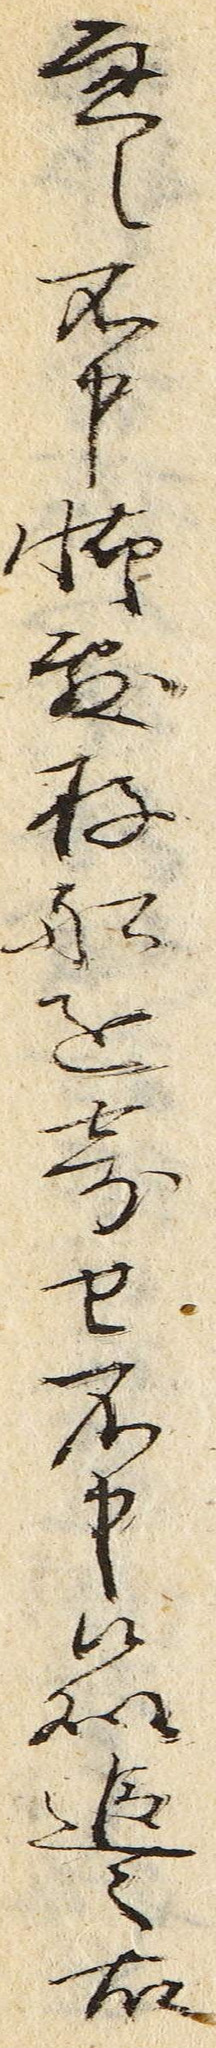通し不申怖敷存船を寄セ不申候処追々右

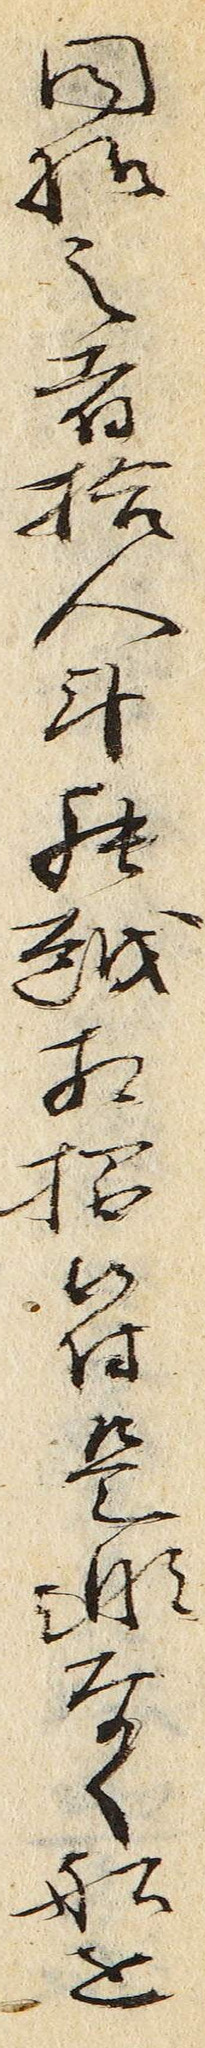同様之者拾人斗罷越相招候付是非なく船を
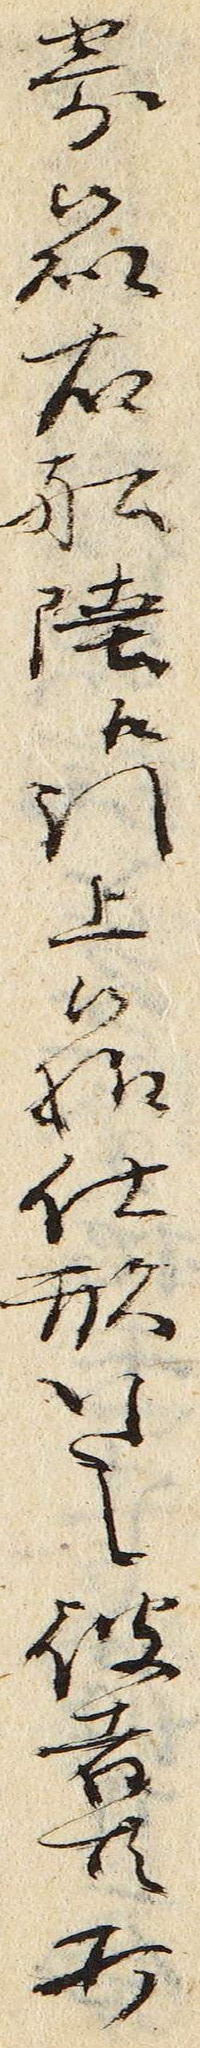寄候処右船陸え引上候様仕形いたし彼者共打
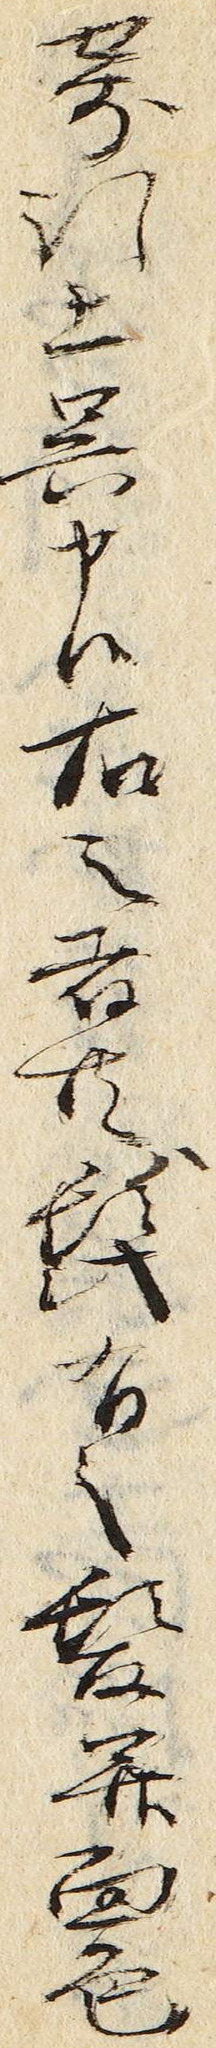寄引上呉申候右之者共髭有之髪并面色
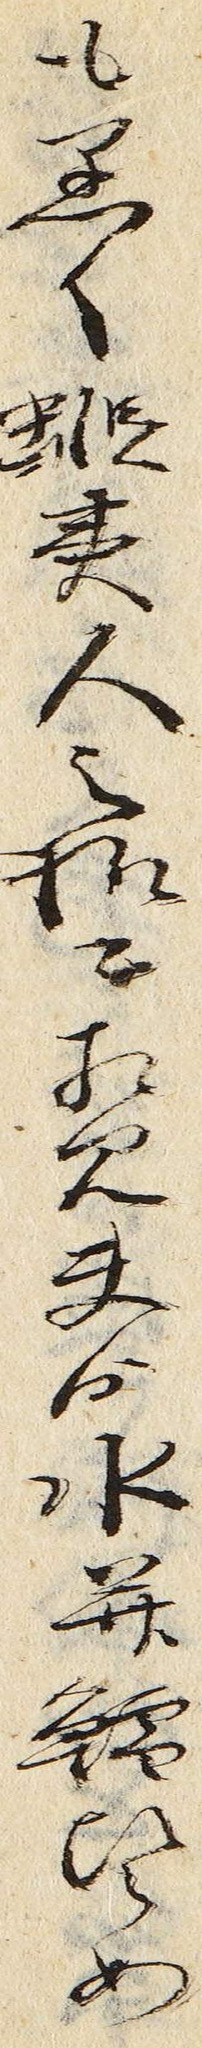も黒く蝦夷人之様に相見夫ゟ水并鱈ひらめ
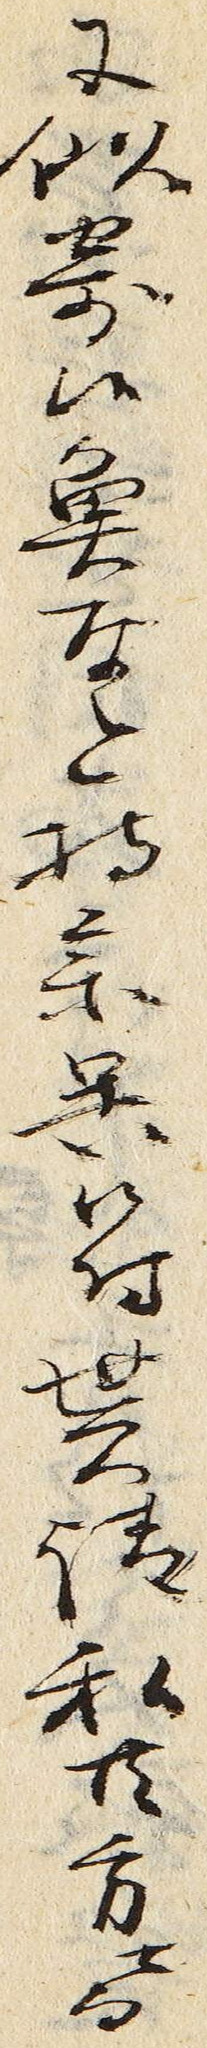に似寄候魚なと持参呉候付貰請私共方にて
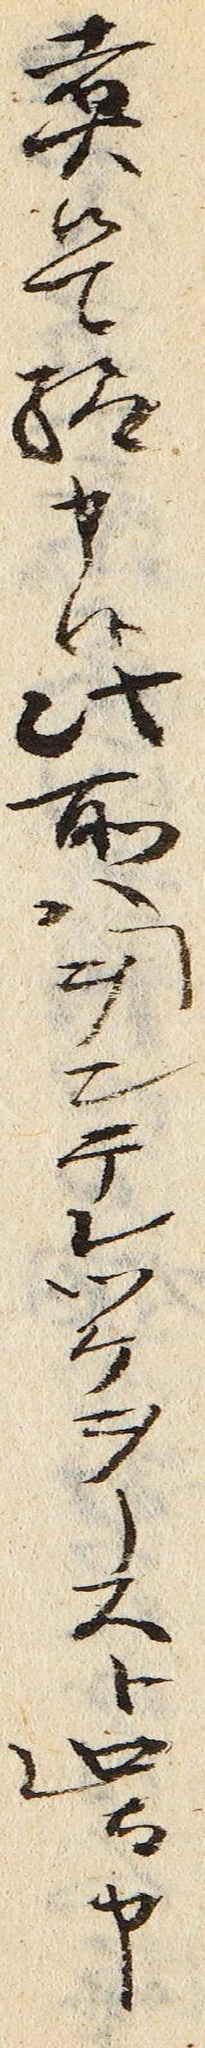煮候て給申候此所は「ヲンテレツケヲーストロ」と申
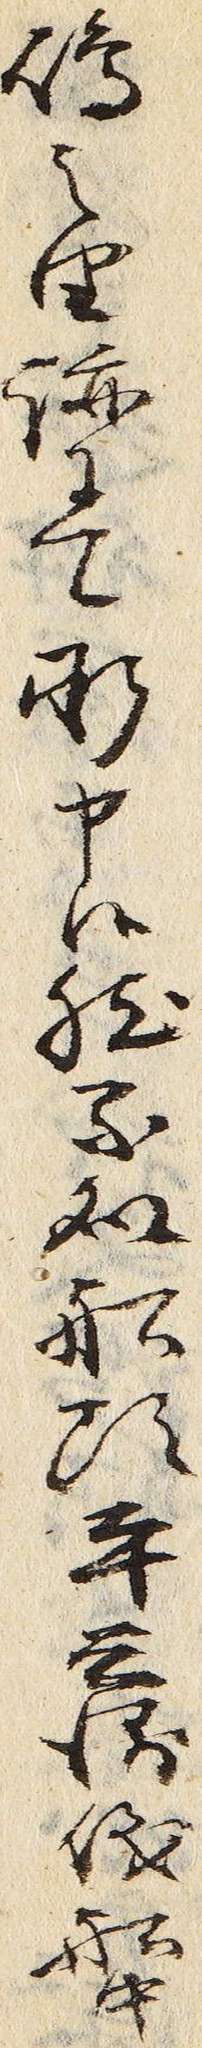島之由跡にて承申候然る処船頭平兵衛儀船中
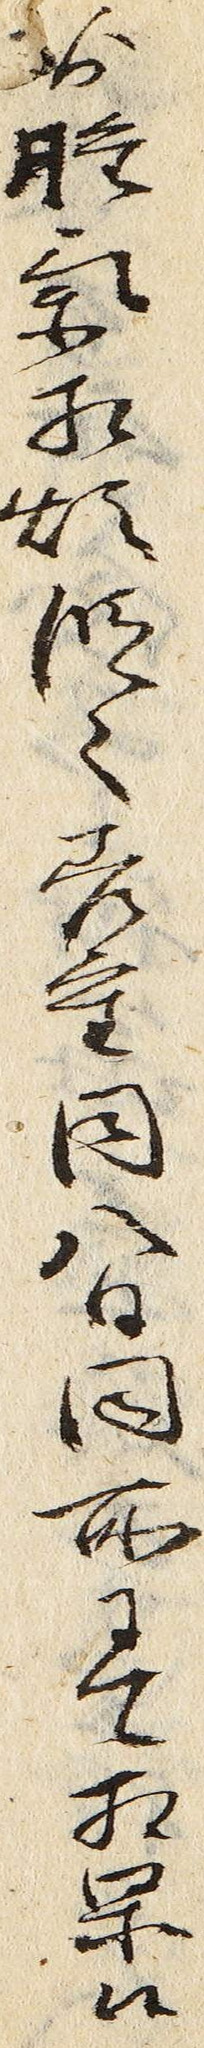ゟ腫気相煩段々差重同八日同所にて相果候
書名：漂民後記
